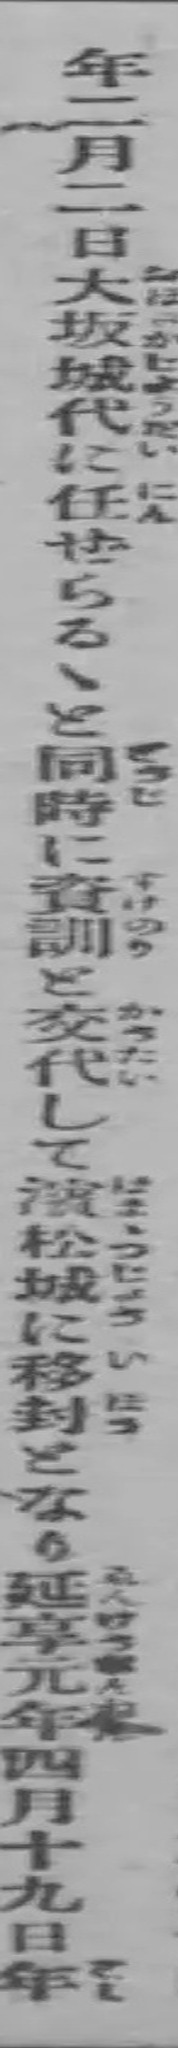年二月二日大坂城代に任ぜらるゝと同時に資訓と交代して浜松城に移封となり延享元年四月十九日年
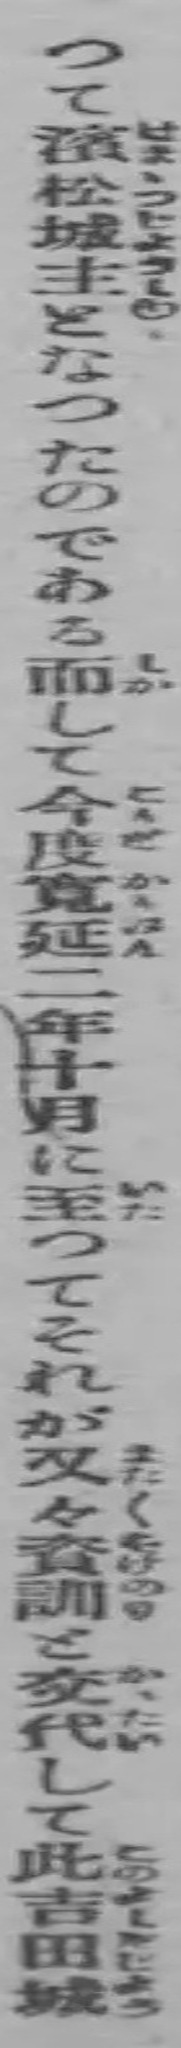つて浜松城主となつたのである而して今度寛延二年十月に至つてそれが又々資訓と交代して此吉田城
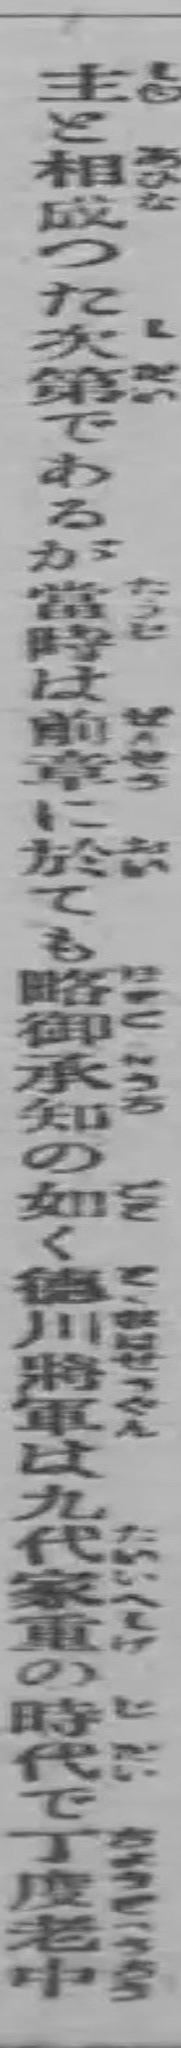主と相成つた次第であるが当時は前章に於ても略御承知の如く徳川将軍は九代家重の時代で丁度老中
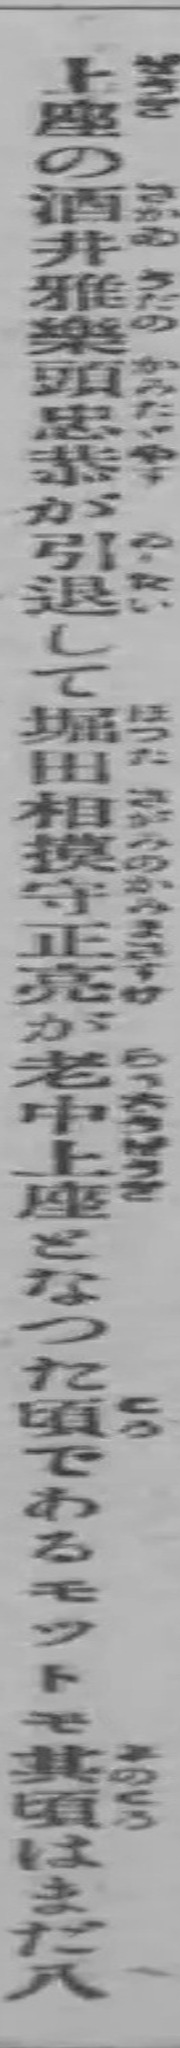上座の酒井雅樂守忠恭が引退して堀田相模守正亮が老中上座となつた頃であるモツトモ其頃はまだ八
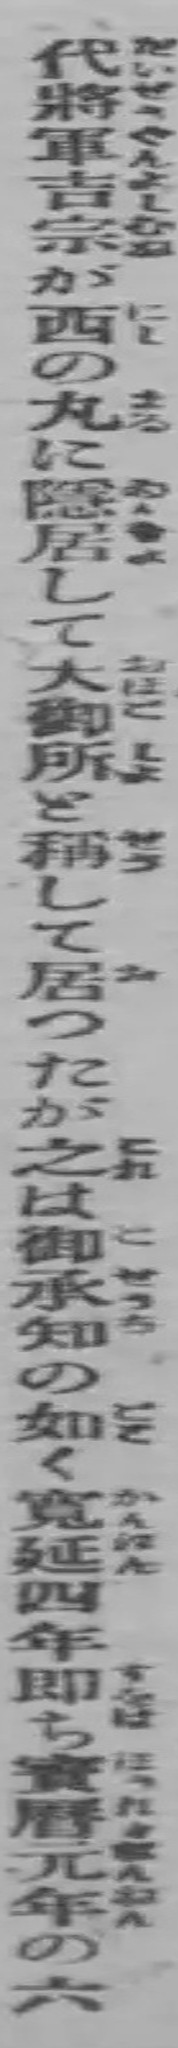天下の大勢代将軍吉宗が西の丸に隠居して大御所と称して居つたが之は御承知の如く寛延四年即ち宝暦元年の六
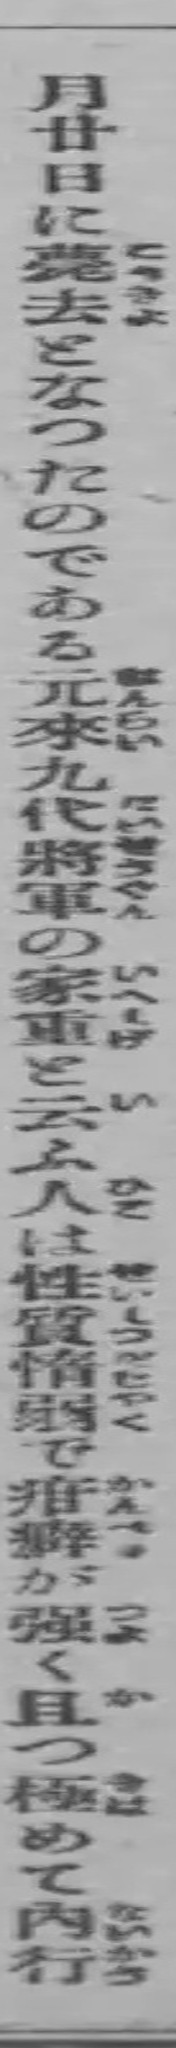月廿日に薨去となつたのである元来九代将軍の家重と云ふ人は性質惰弱で疳癖が強く且つ極めて内行
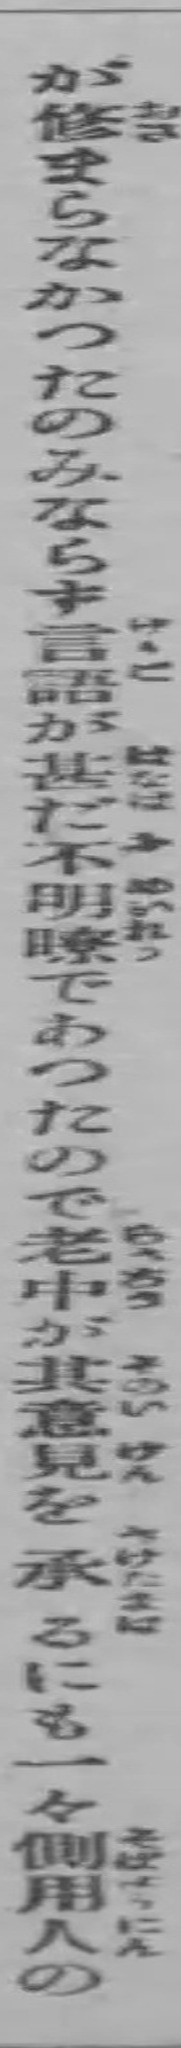が修まらなかつたのみならず言語が甚だ不明瞭であつたので老中が其意見を承るにも一々側用人の
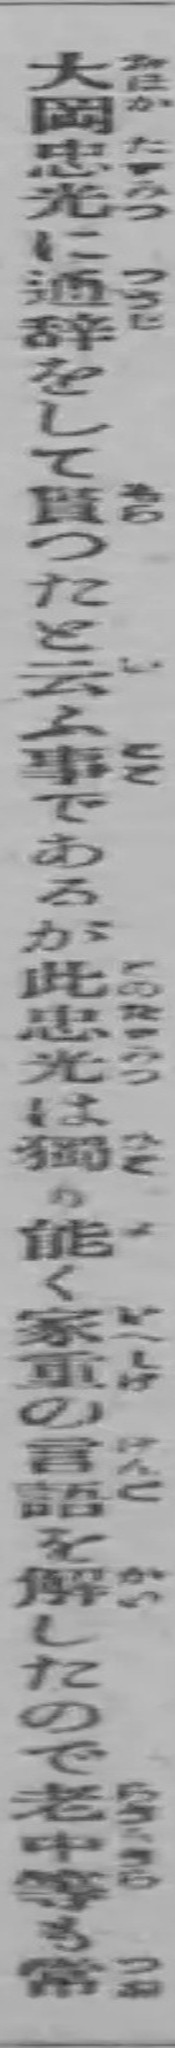大岡忠光に通辞をして貰つたと云ふ事であるが此忠光は独り能く家重の言語を解したので老中等も常
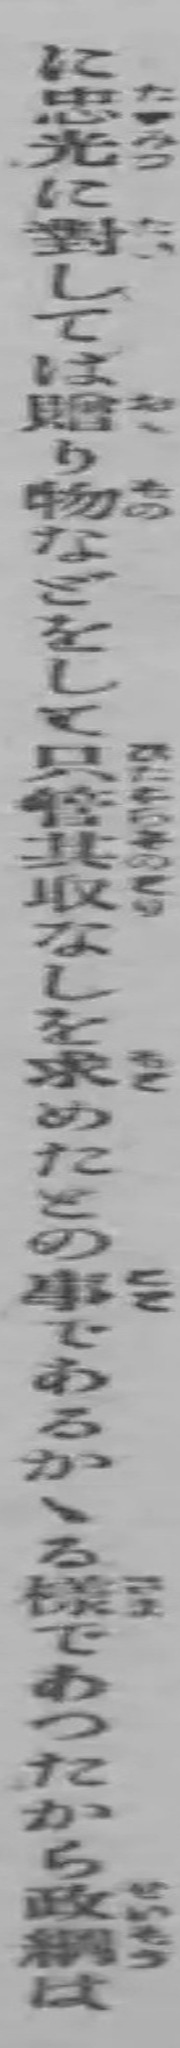に忠光に対しては贈り物などをして只管其取なしを求めたとの事であるかゝる様であつたから政網は
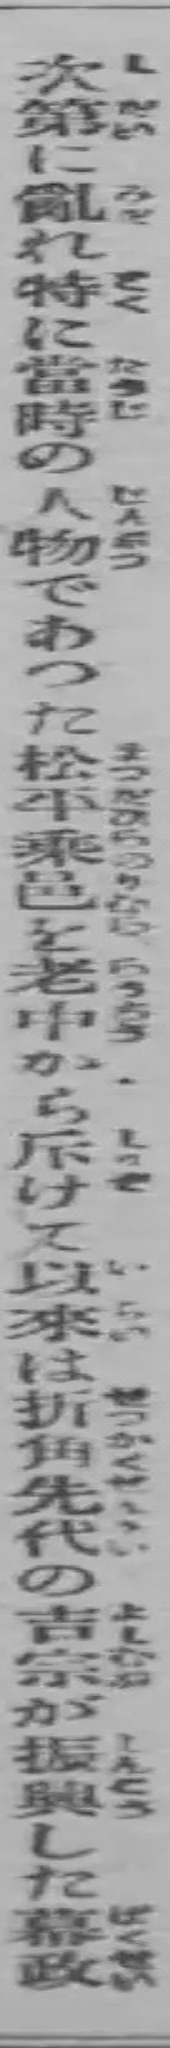次第に乱れ特に当時の人物であつた松平乗邑を老中から斥けて以来は折角先代の吉宗が振興した幕政
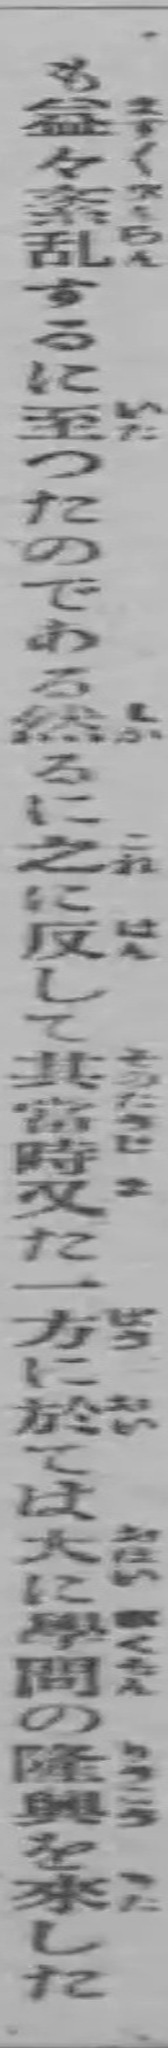も益々紊乱するに至つたのである然るに之に反して其当時又た一方に於ては大に学問の隆興を来した
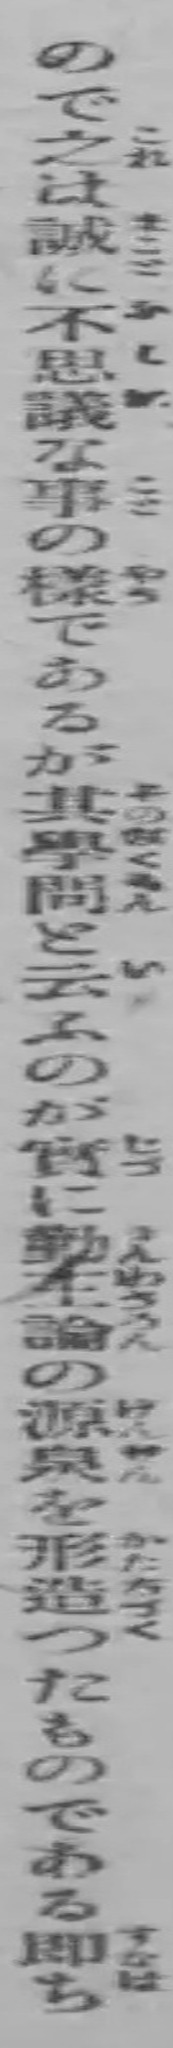ので之は誠に不思議な事の様であるが其学問と云ふのが実に勤王論の源泉を形造つたものである即ち
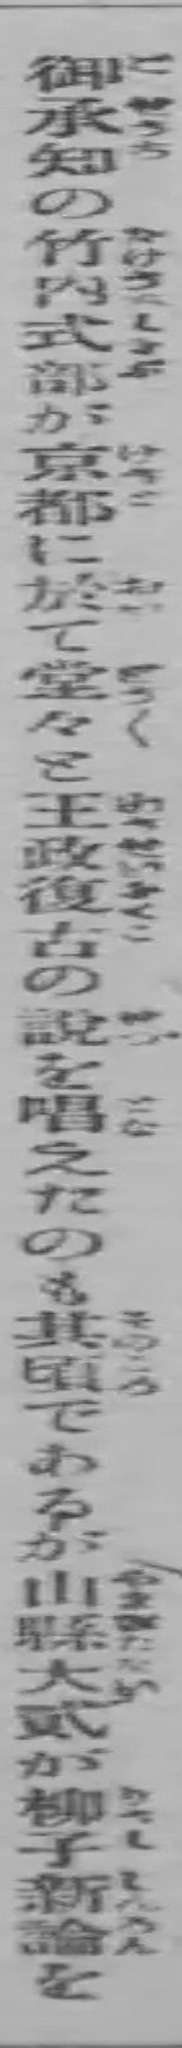御承知の竹内式部が京都に於て堂々王政復古の説を唱えたのも其頃であるが山縣大弐が柳子新論を
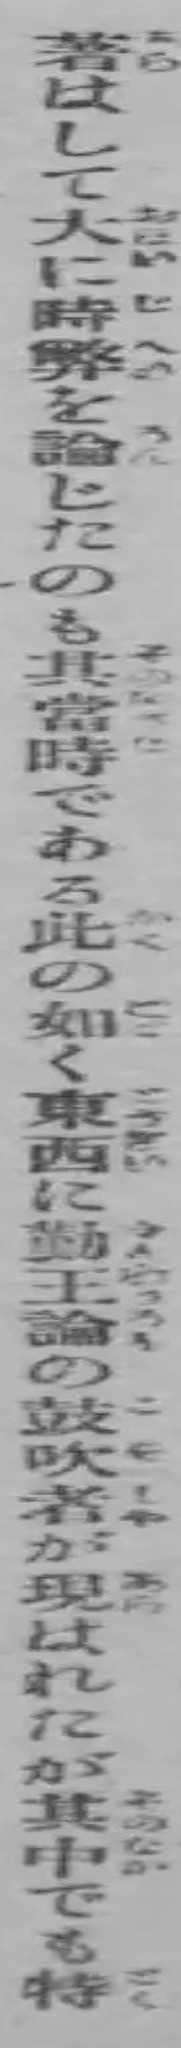著はして大に時弊を論じたのも其当時である此の如く東西に勤王論の鼓吹者が現はれたが其中でも特
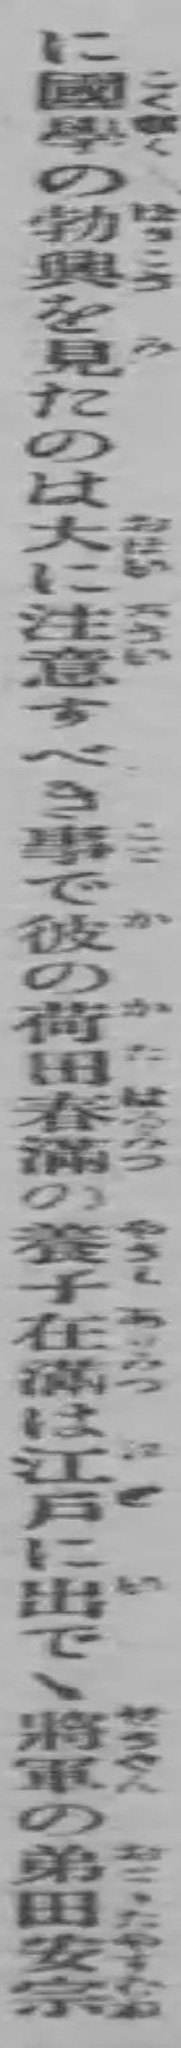に国学の勃興を見たのは大に注意すべき事で彼の荷田春満の養子在満は江戸に出でゝ将軍の弟田安宗
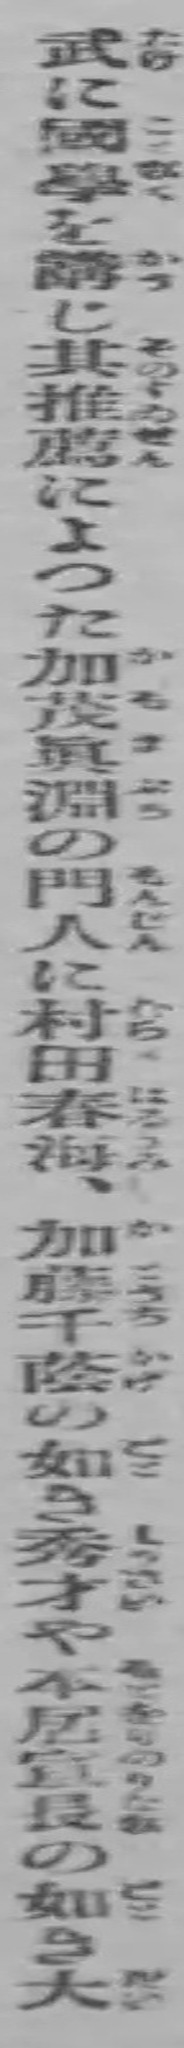武に国学を講じ其推薦によつた加茂真淵の門人に村田春海、加藤千蔭の如き秀才や本居宣長の如き大
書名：豊橋市史談
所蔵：国立国会図書館 National Diet Library, JAPAN
